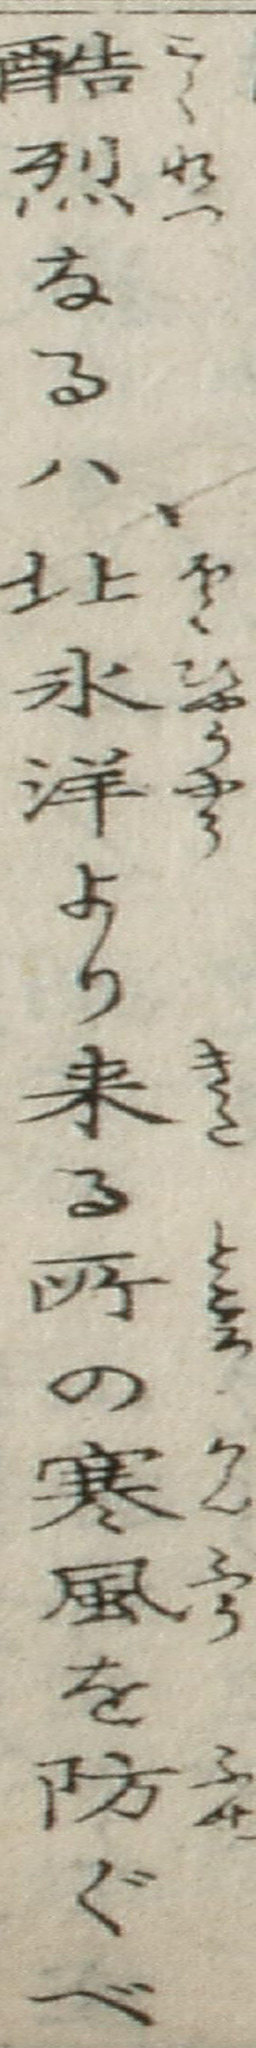酷烈なるは、北氷洋より来る所の寒風を防ぐべ

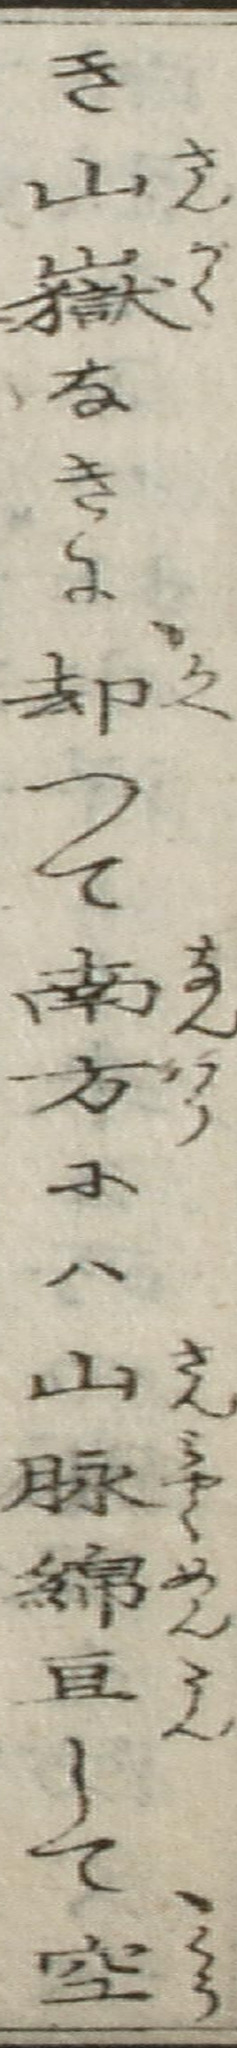き山嶽なきに、却つて南方には山脈綿亘して、空
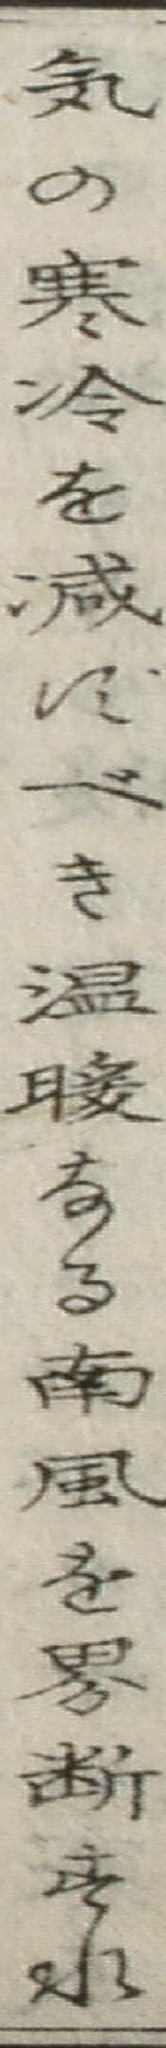気の寒冷を減ずべき温暖なる南風を界断すれ
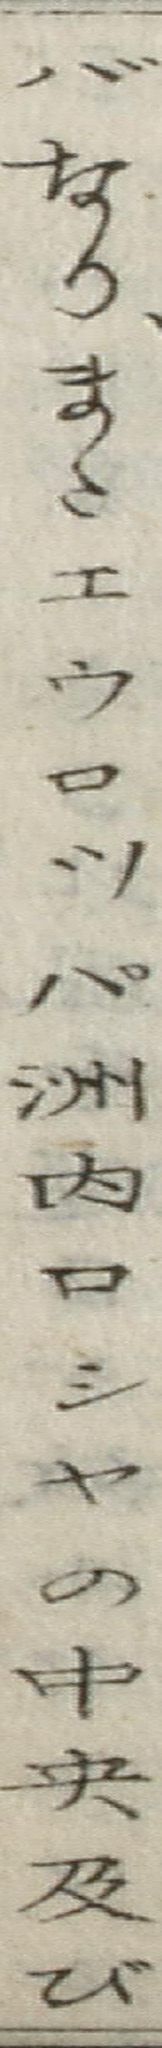ばなり、またエウロツパ洲内ロシヤの中央及び
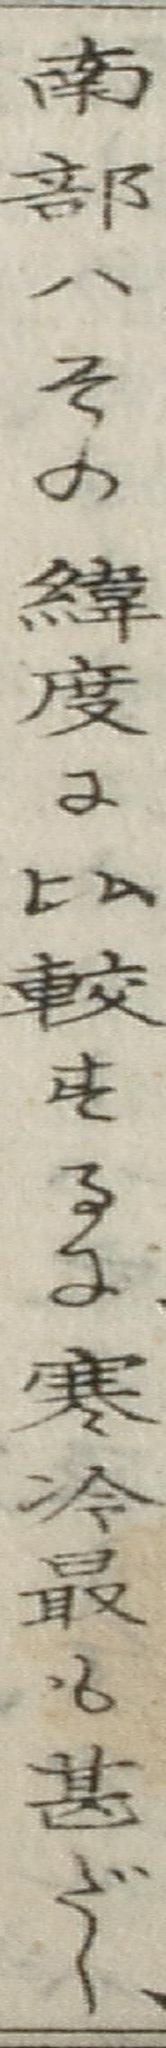南部は、その緯度に比較するに、寒冷最も甚だし、
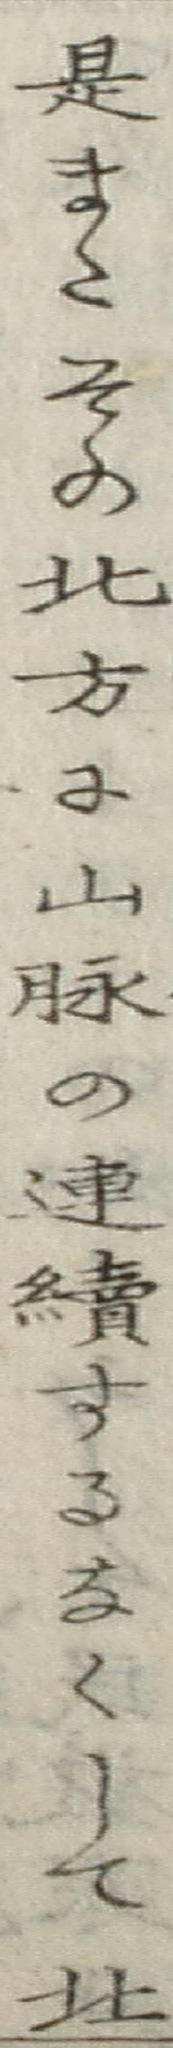是またその北方に山脈の連続するなくして、北
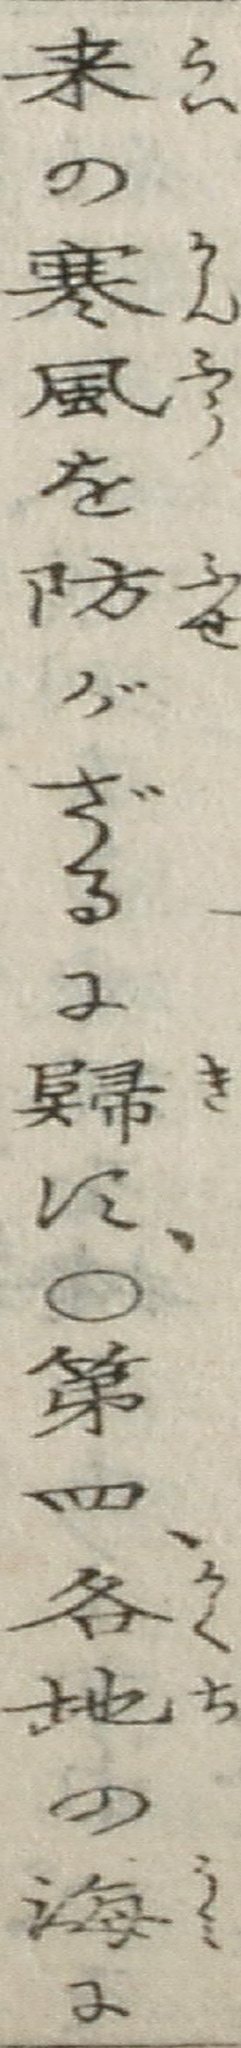来の寒風を防がざるに帰す、○第四、各地の海に
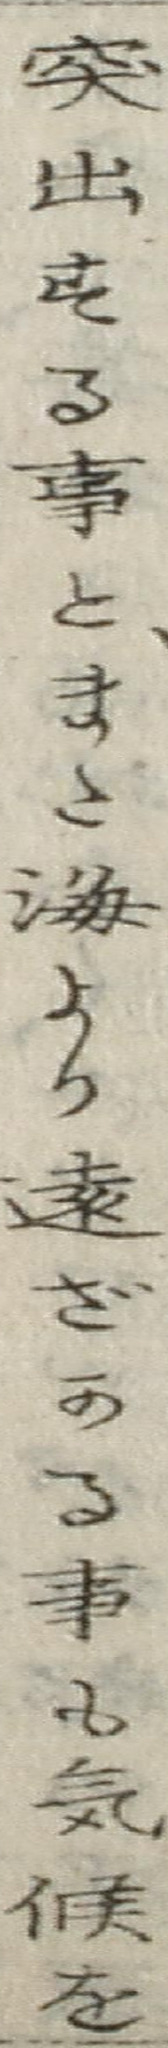突出する事と、また海より遠ざかる事も、気候を
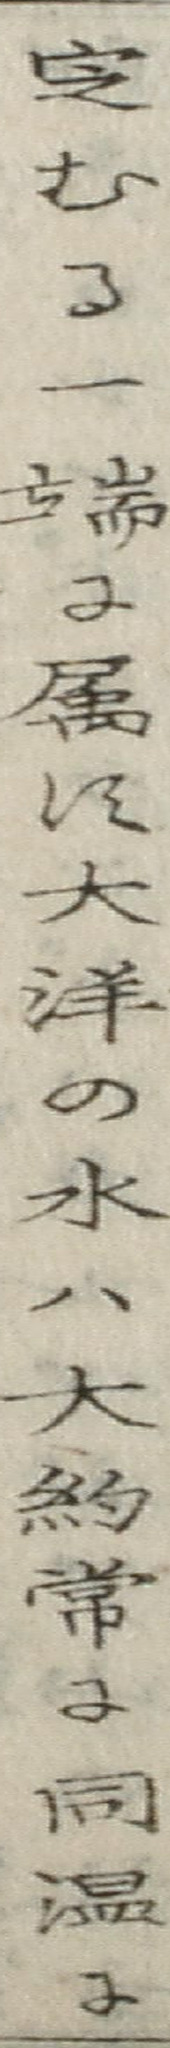定むる一端に属す、大洋の水は大約常に同温に
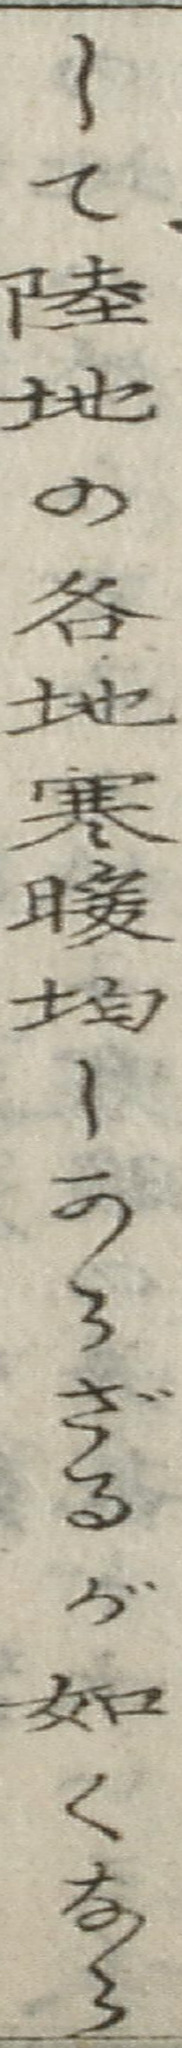して、陸地の各地寒暖均しからざるが如くなら
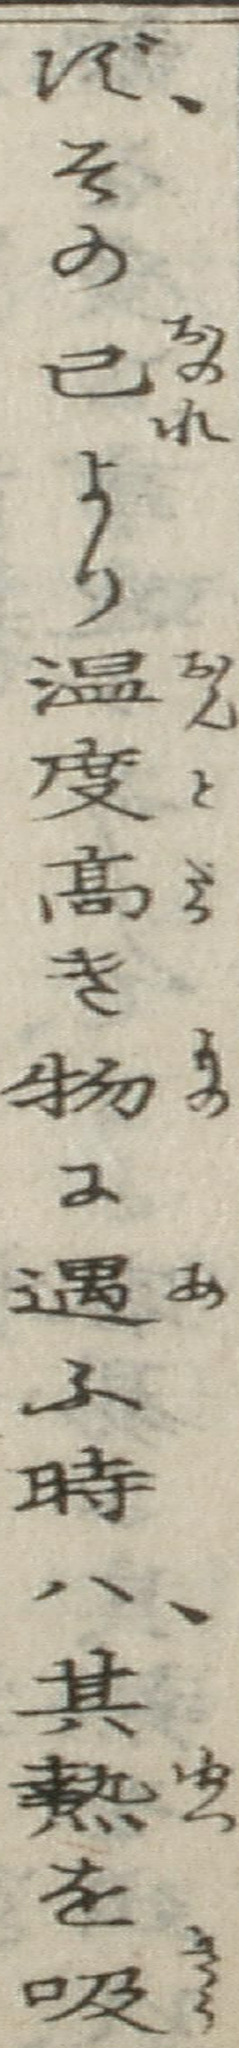ず、その己より温度高き物に遇ふ時は、其熱を吸
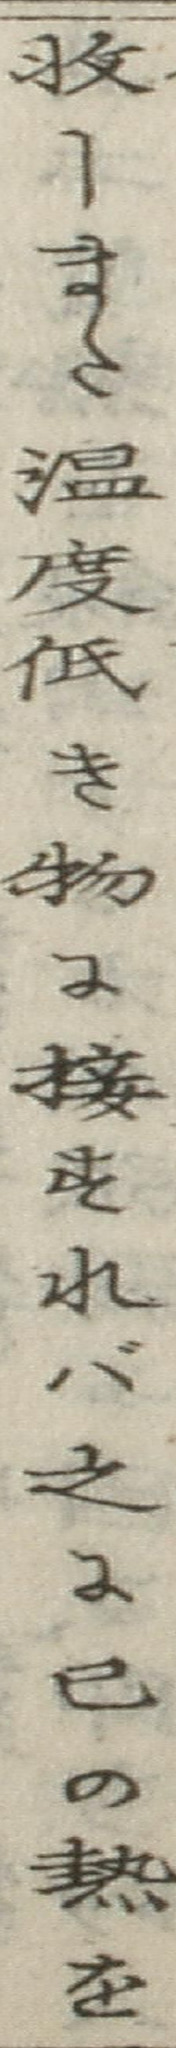収しまた温度低き物に接すれば之に己の熱を
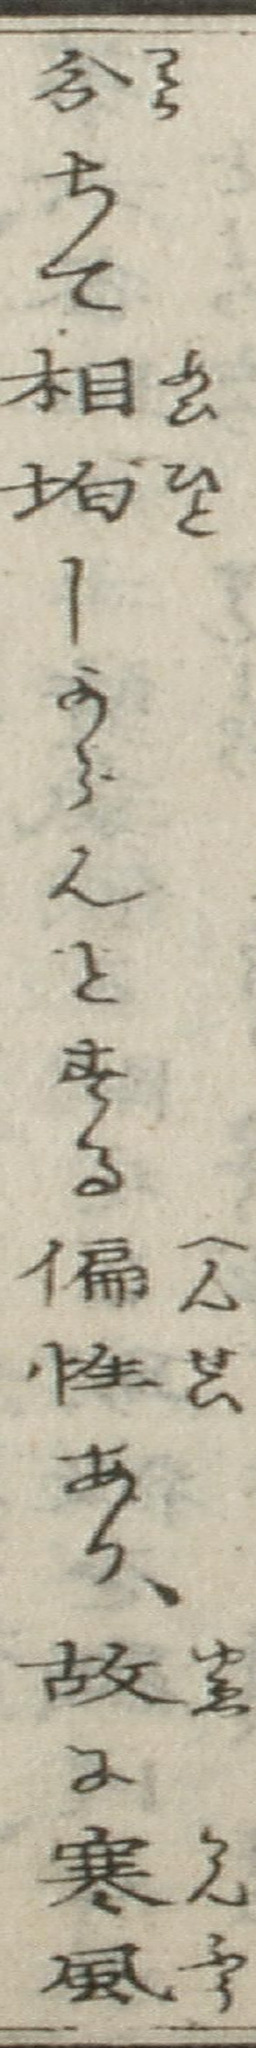分ちて相均しからんとする偏性あり、故に寒風
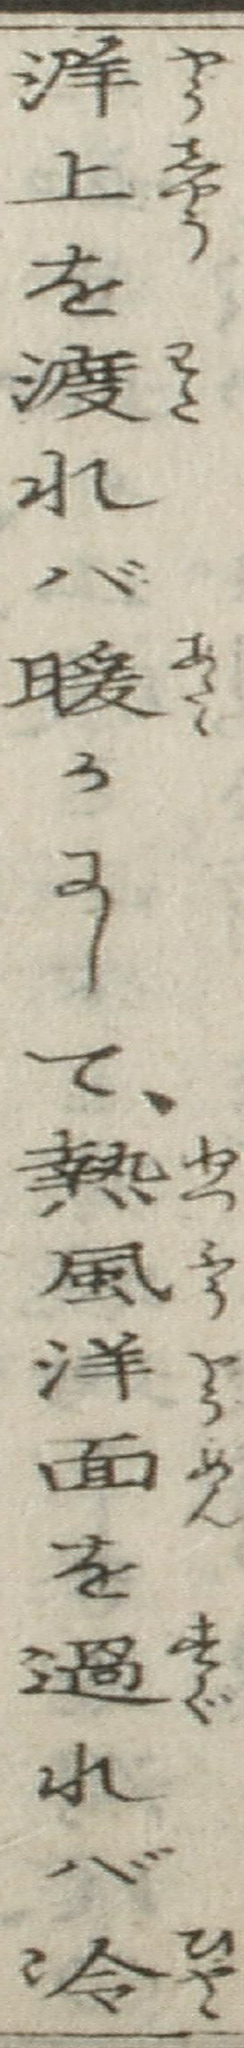洋上を渡れば暖かにして、熱風洋面を過れば冷
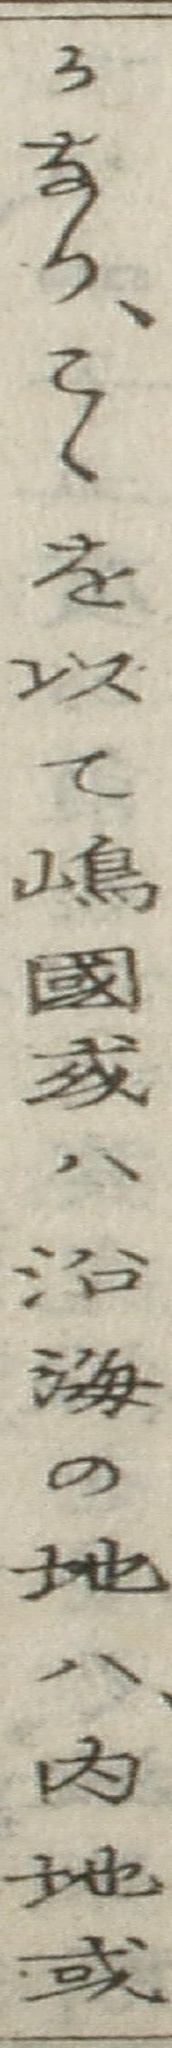かなり、こゝを以て島国或は沿海の地は、内地或
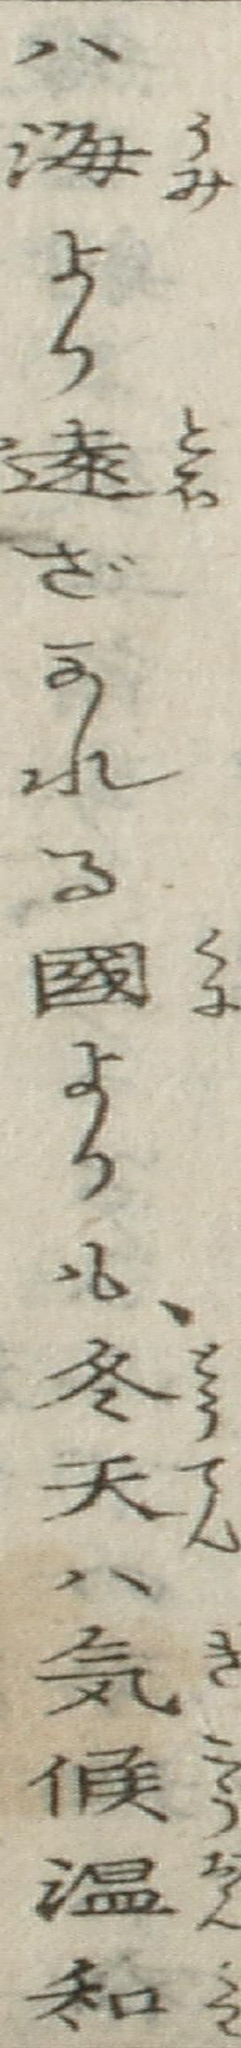は海より遠ざかれる国よりも、冬天は気候温和
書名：訓蒙　天然地理學　下
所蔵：東京大学地震研究所図書室 Earthquake Research Institute Library, The University of Tokyo, JAPAN
